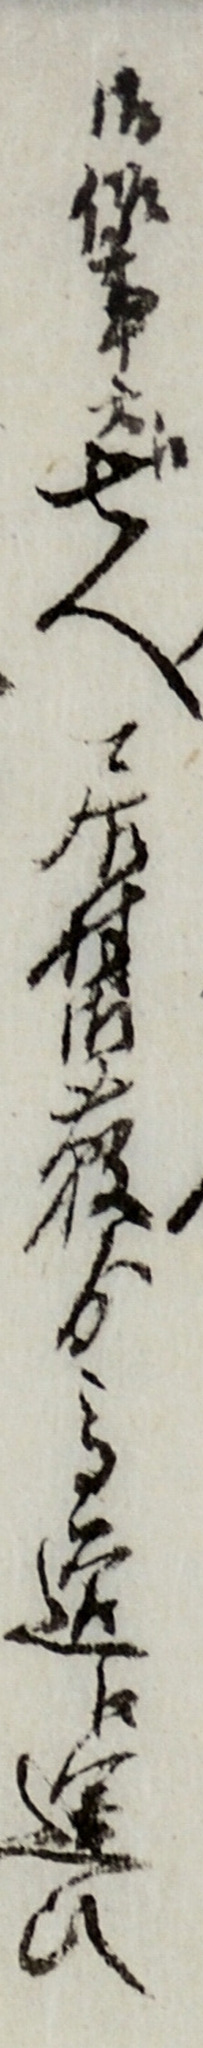御作事方江七人居村御籔ゟ高遠江運ひ
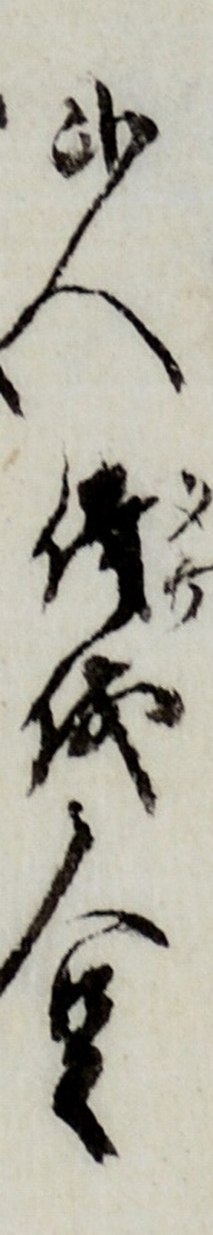弐人竹伐人足
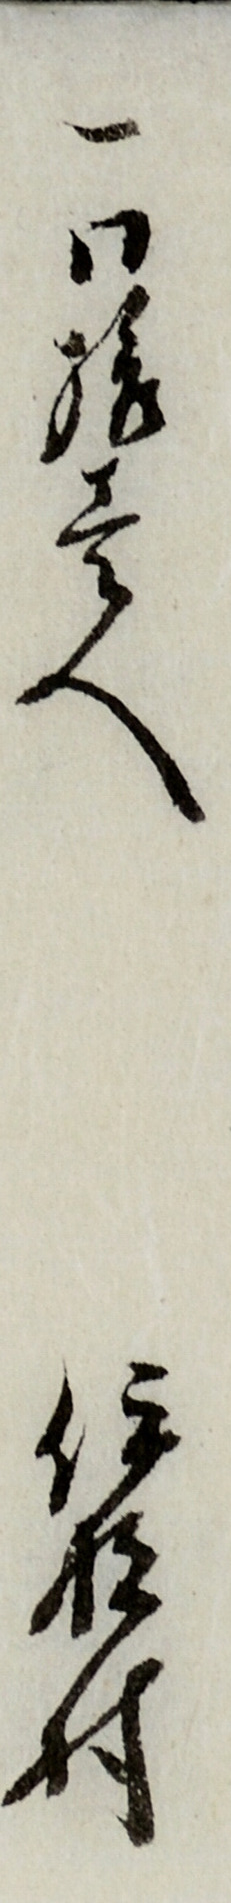一同拾壱人伊那村
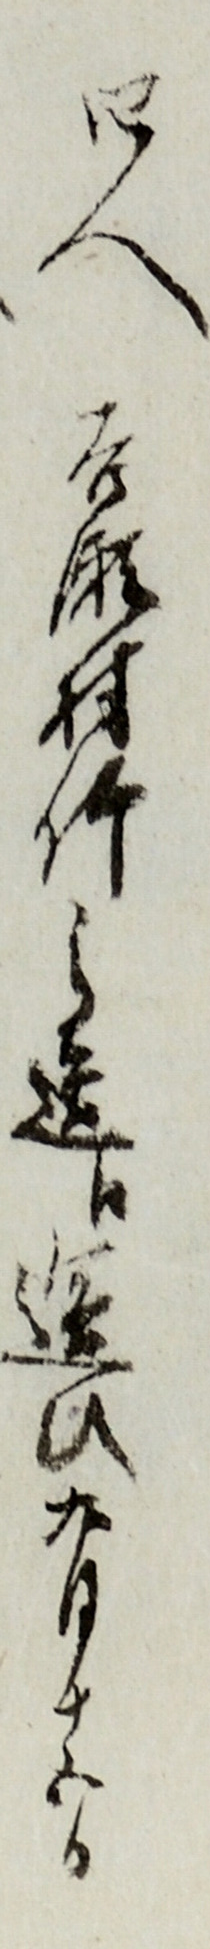四人吉瀬村竹高遠江運ひ九月十五日
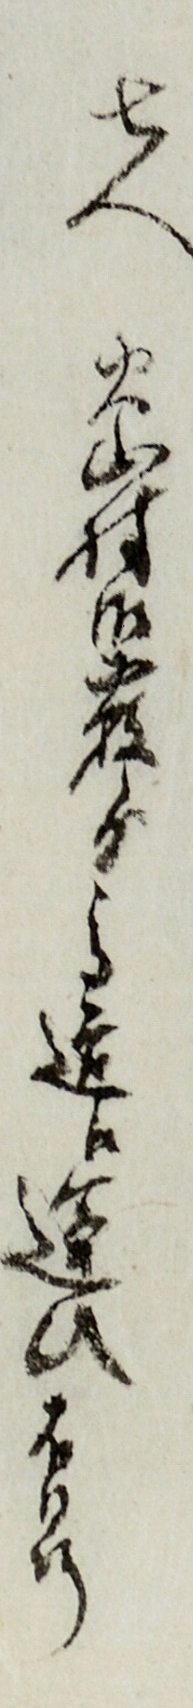七人火山村御籔ゟ高遠江運ひ右同断
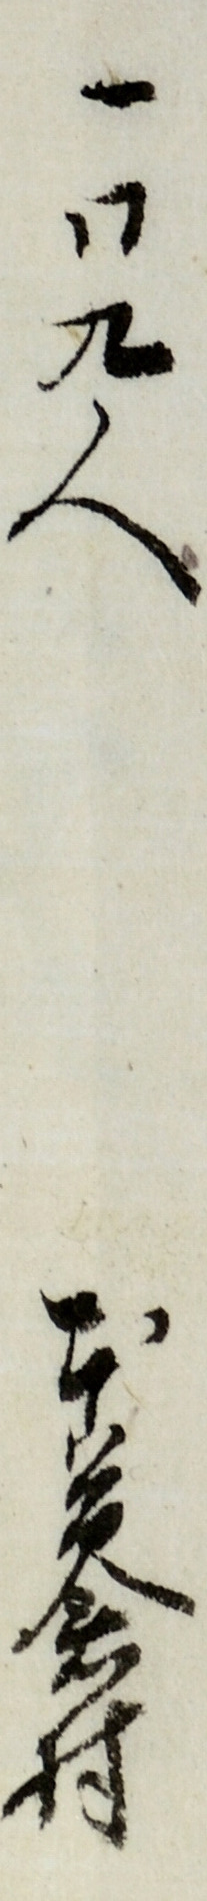一同九人本曾倉村
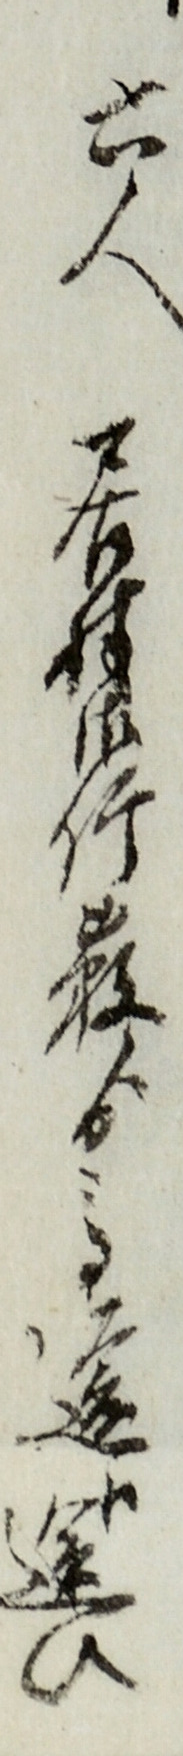六人居村御竹藪ゟ高遠江運ひ
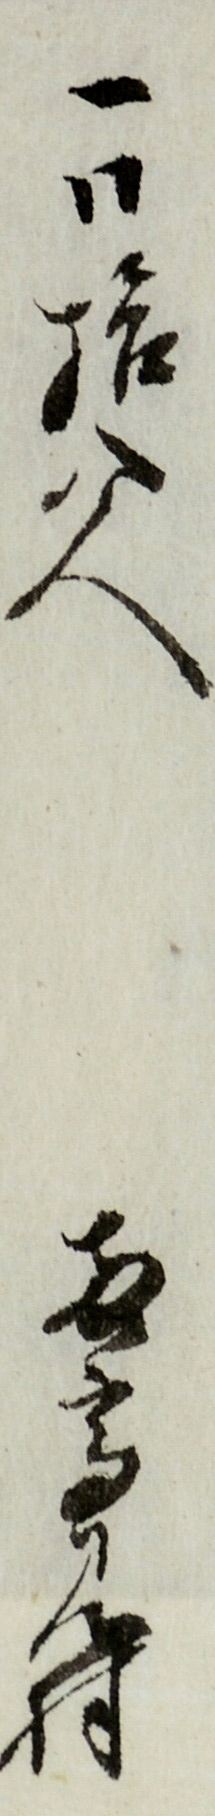一同拾八人両高見村
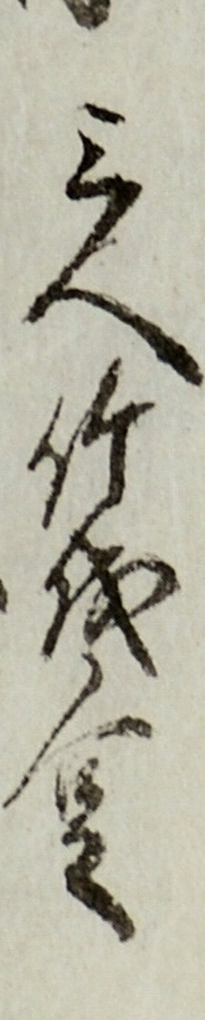内三人竹伐人足
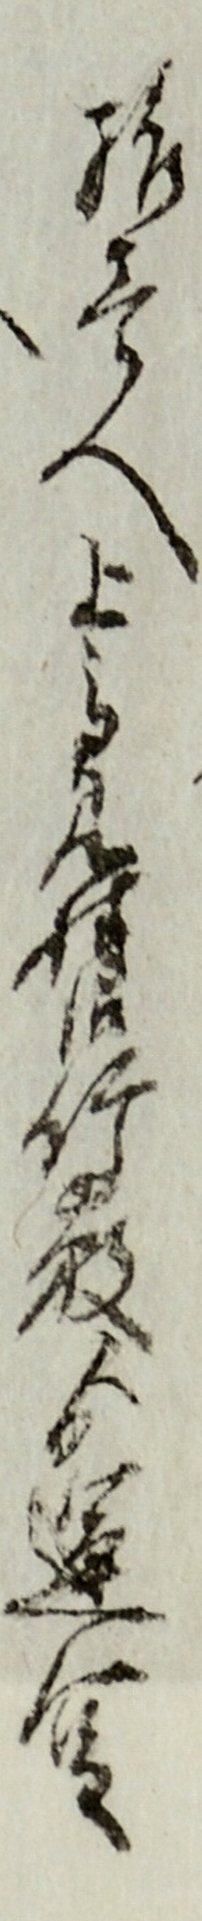拾壱人上高見村御竹藪ゟ運人足
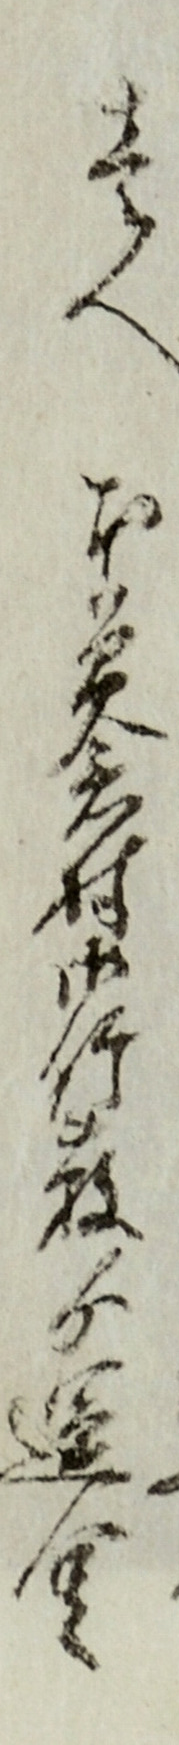壱人本曾倉村御竹藪ゟ運人足
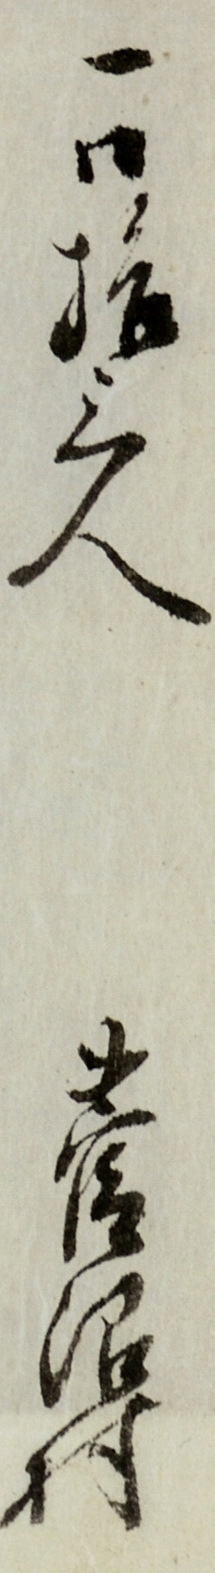一同拾三人菅沼村
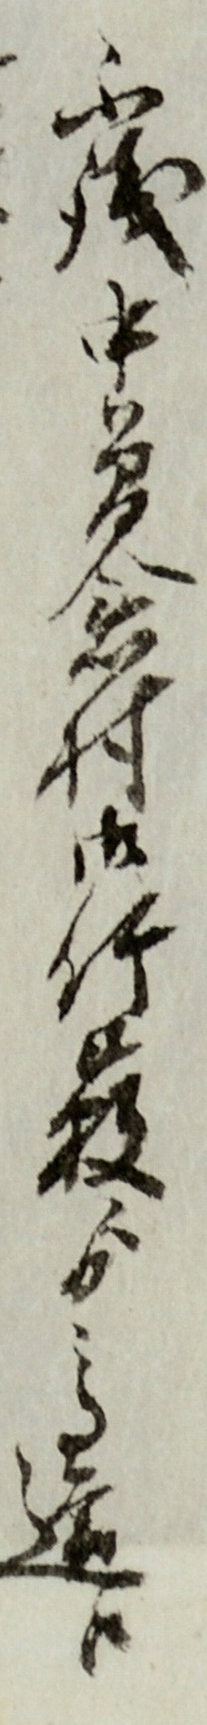不残中曾倉村御竹藪ゟ高遠江

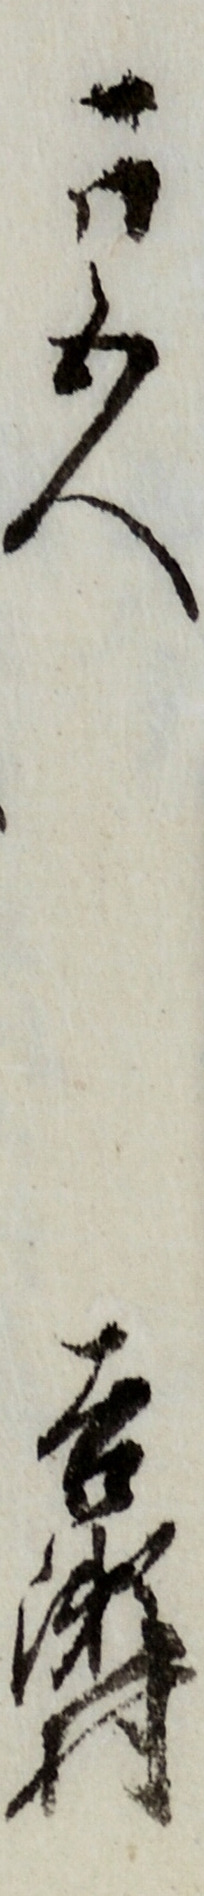一同五人吉瀬村
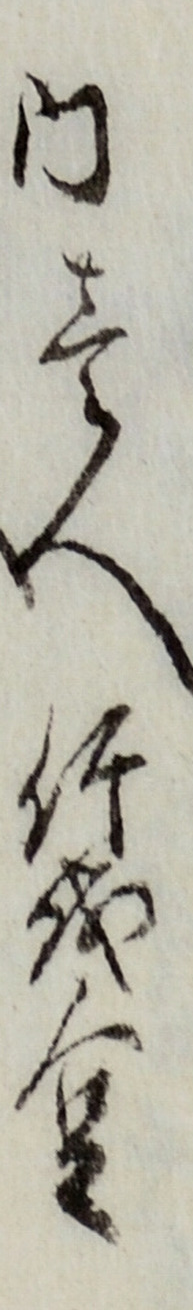内壱人竹伐人足
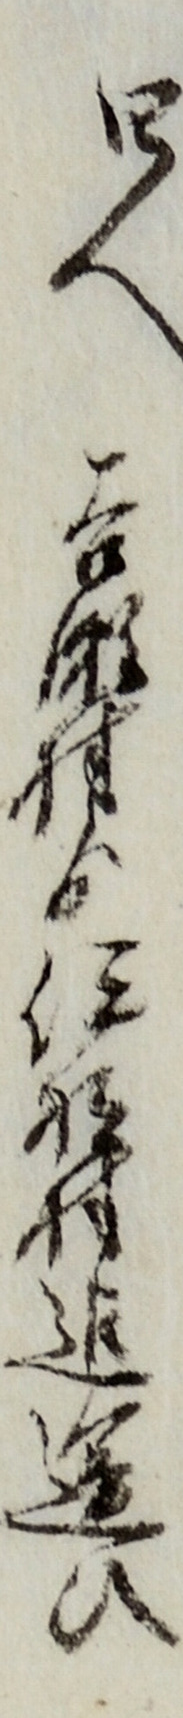四人吉瀬村ゟ伊那村迄運ひ
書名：中沢郷御竹薮見廻り
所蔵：伊那市立高遠町図書館・合同会社AMANE
